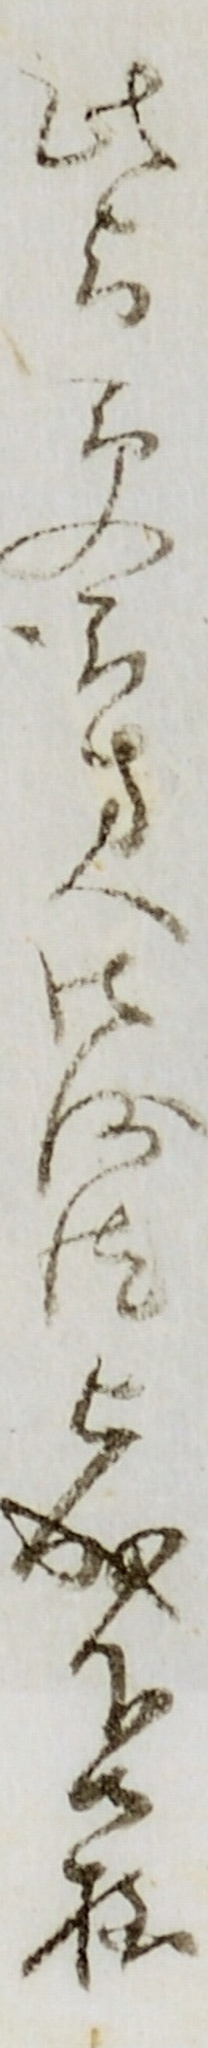此旨受取方へ御沙汰被成下候様
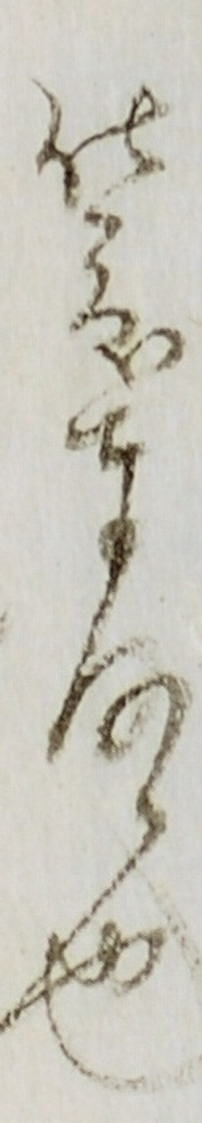仕度奉存候也
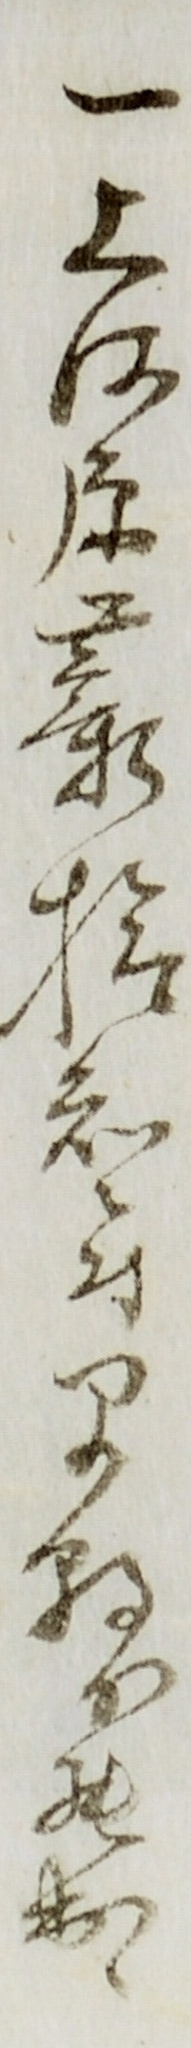一上河原薪検知に付早朝ゟ罷出候
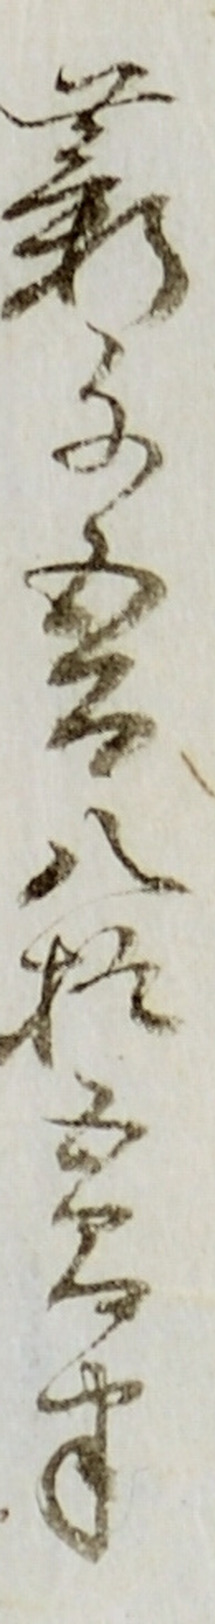薪千五百八拾五間半
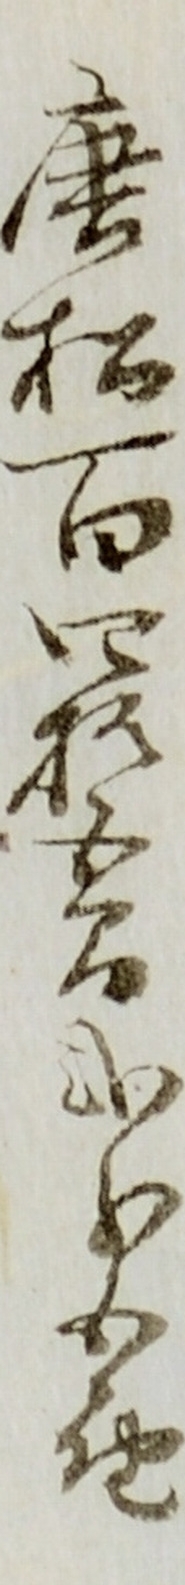唐松百四拾五間弐分五厘
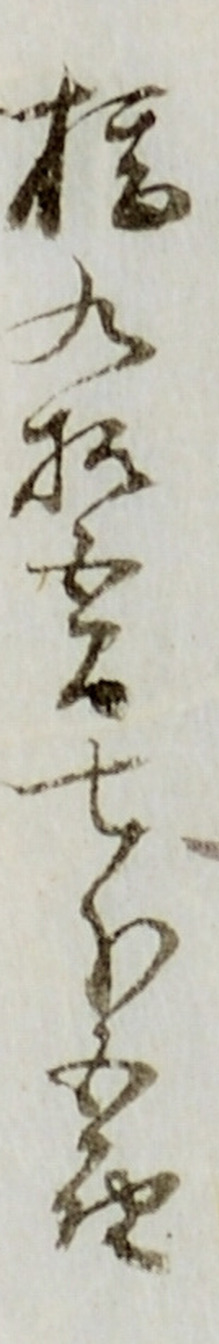椹九拾五間七分五厘
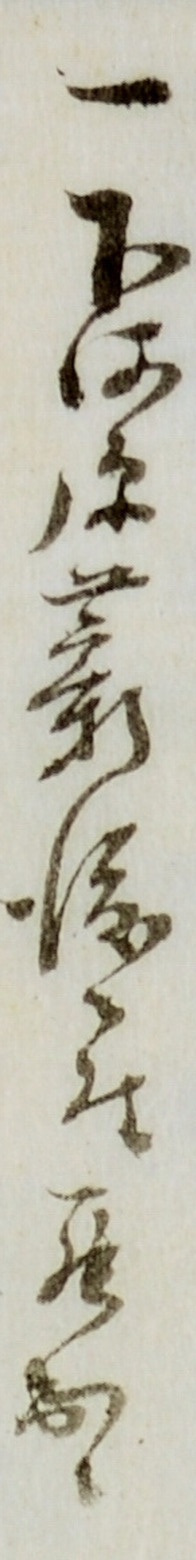一下河原薪渡に付罷出候
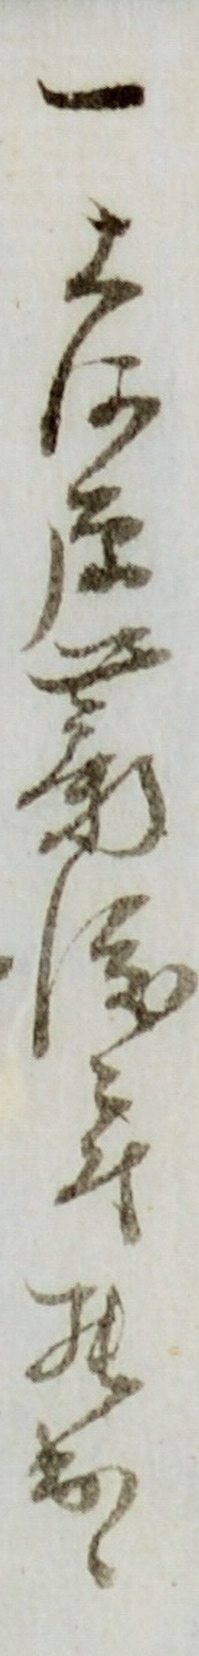一下河原薪渡に付罷出候
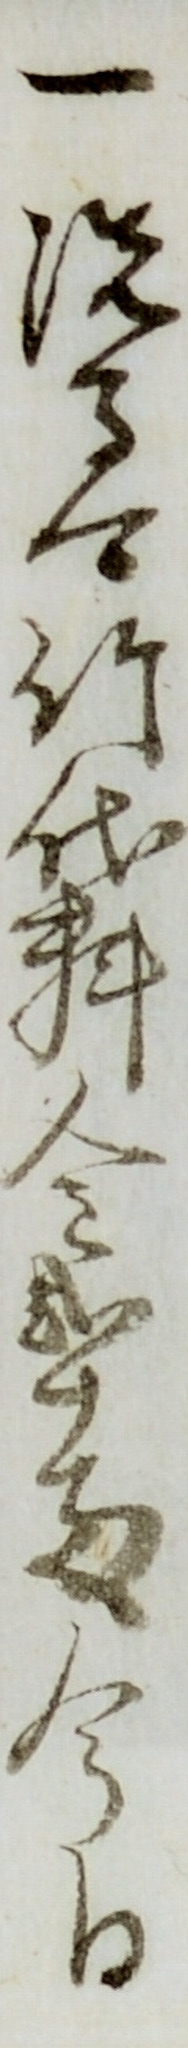一洗馬郷竹代料金弐十両今日
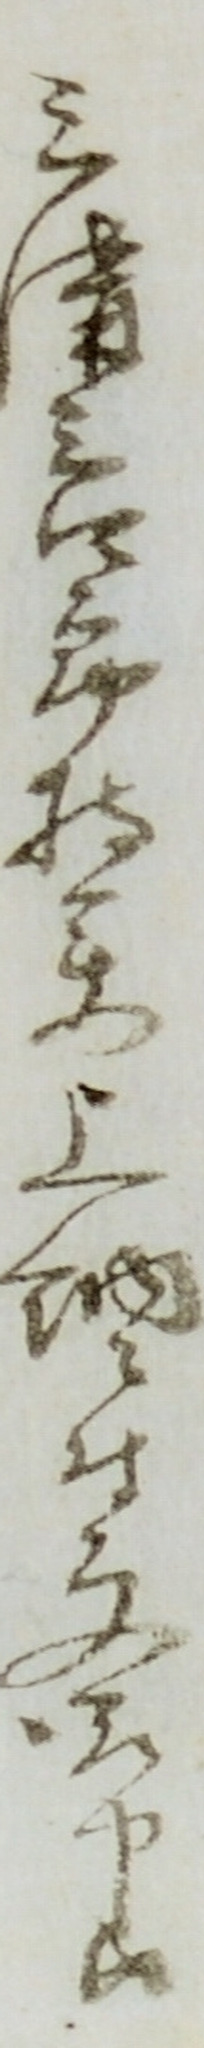三津三四郎持参上納に付受取申候
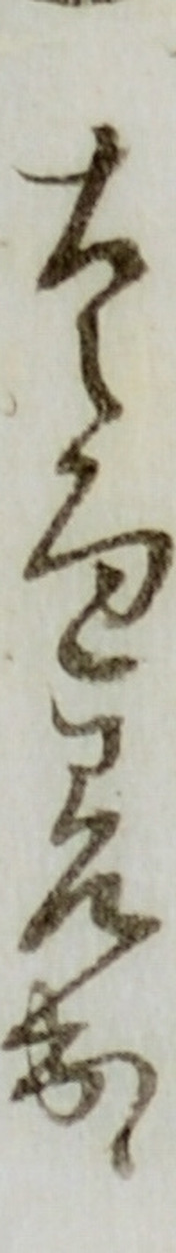一左之通差出候

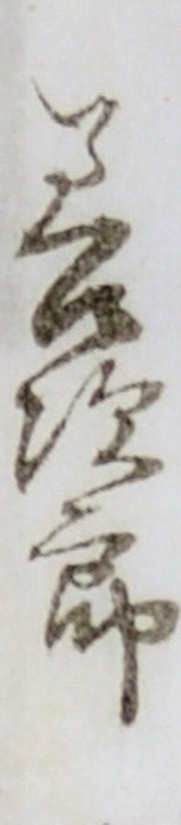善次郎
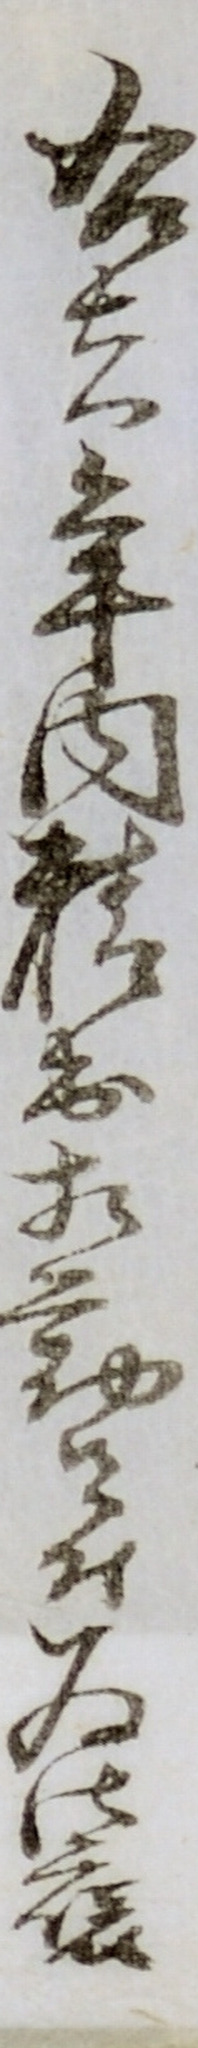右は年内精出相勤候に付為御褒
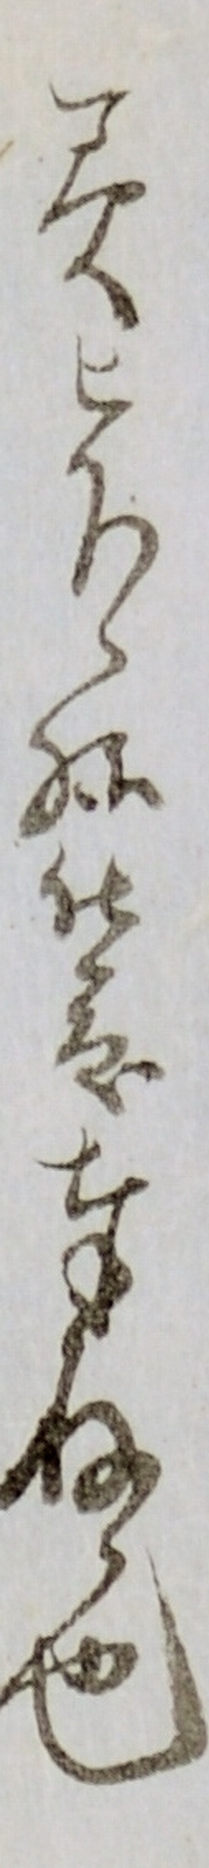美被下候様仕度奉存候也
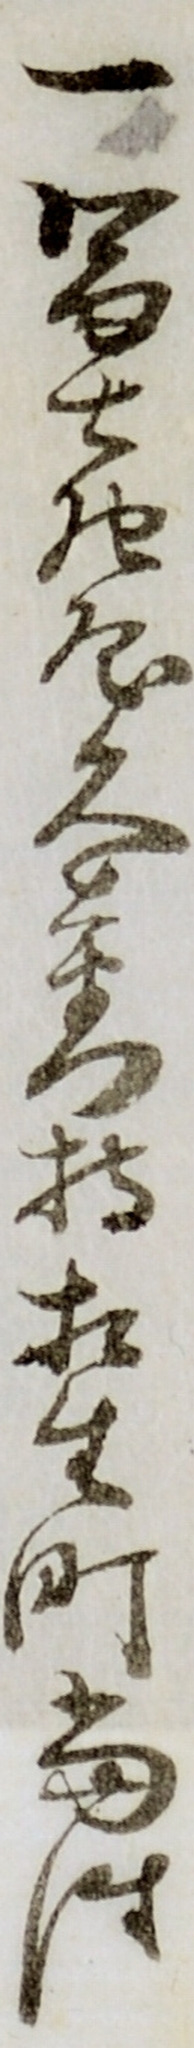一富士野屋久右衛門持相生町当時
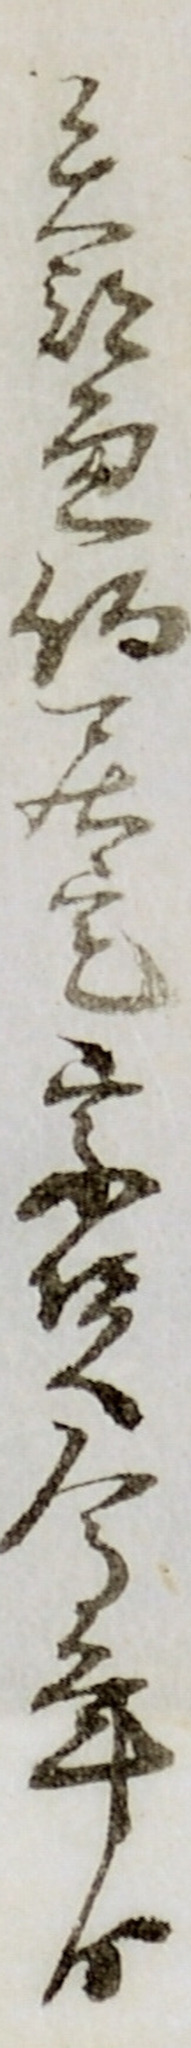矢部通伯居宅家賃今年ゟ
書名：山林方諸事御用留
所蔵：伊那市立高遠町図書館・合同会社AMANE
